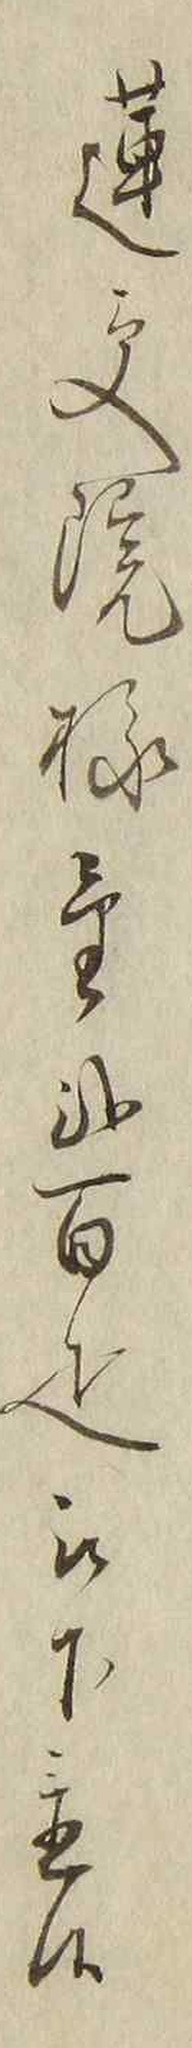蓮受院様金弐百疋被下置候

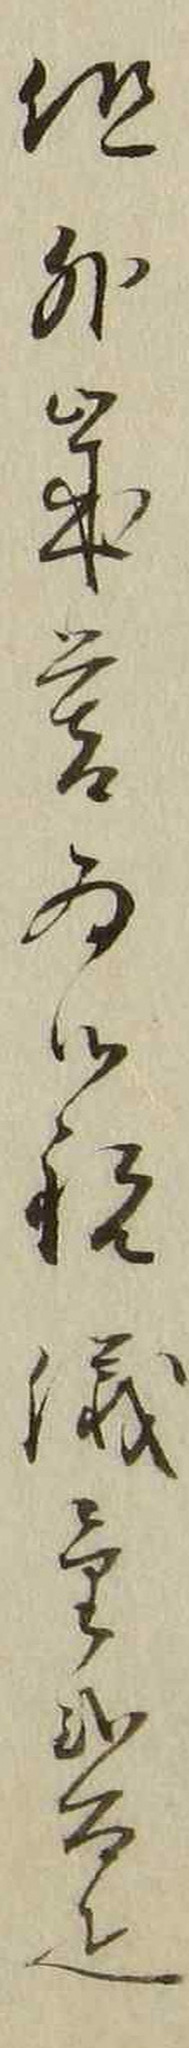但卯歳暮為御祝儀金弐百疋
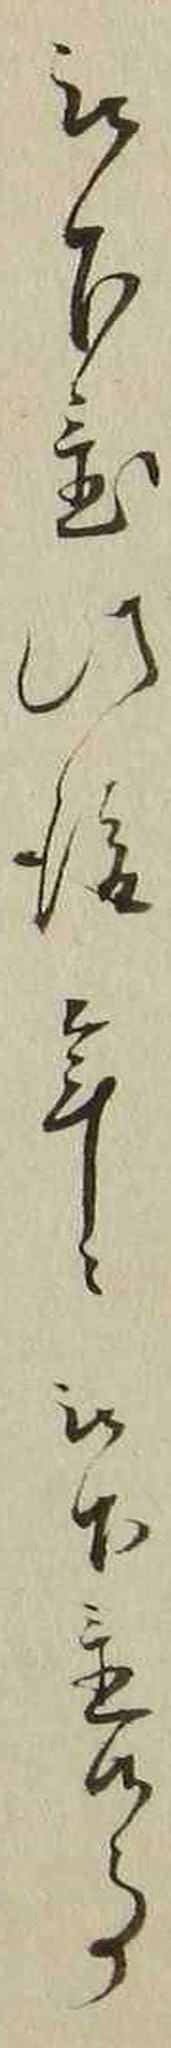被下置此後年々被下置候事
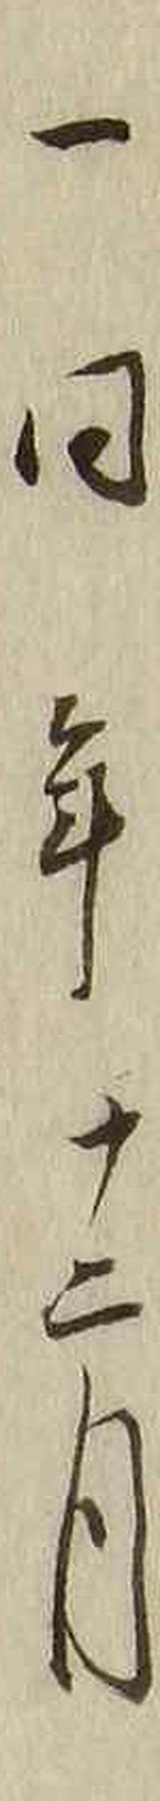一同年十二月
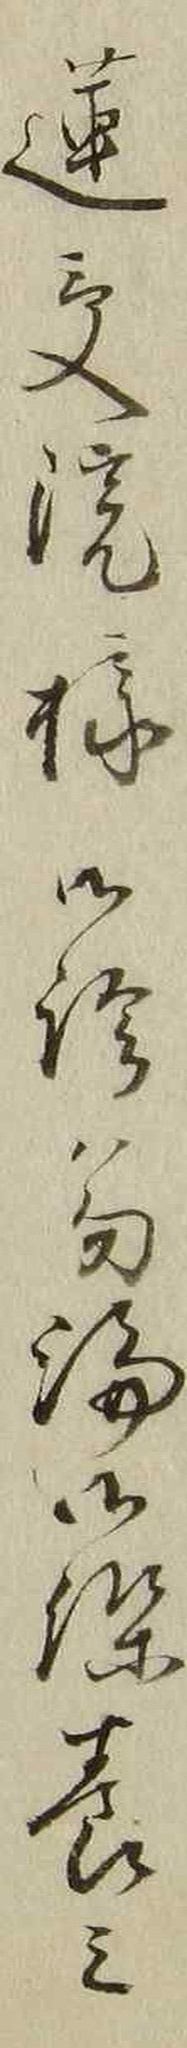蓮受院様御診ハ勿論御保養之
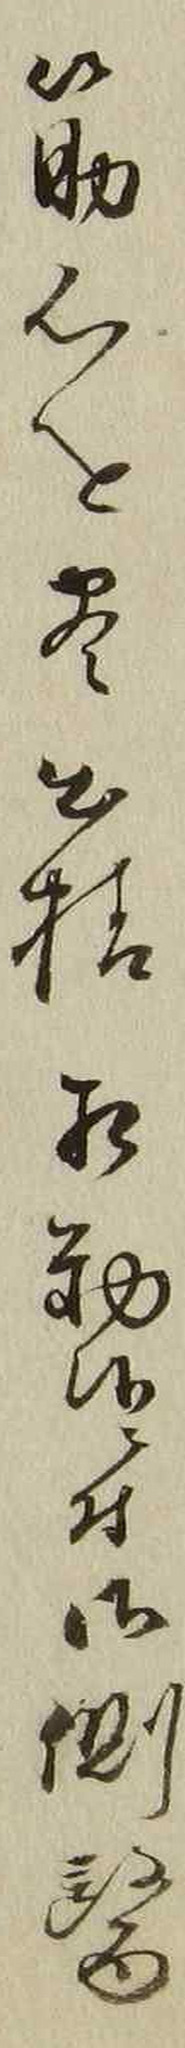筋心を尽出精相勤候ニ付御側医
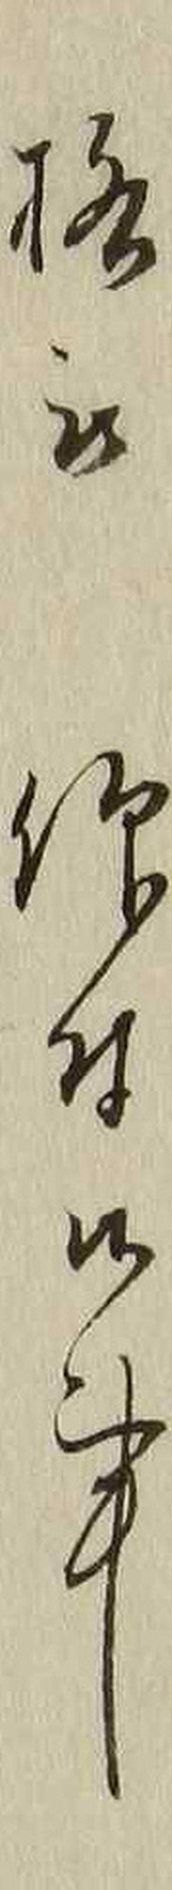格被仰付候事
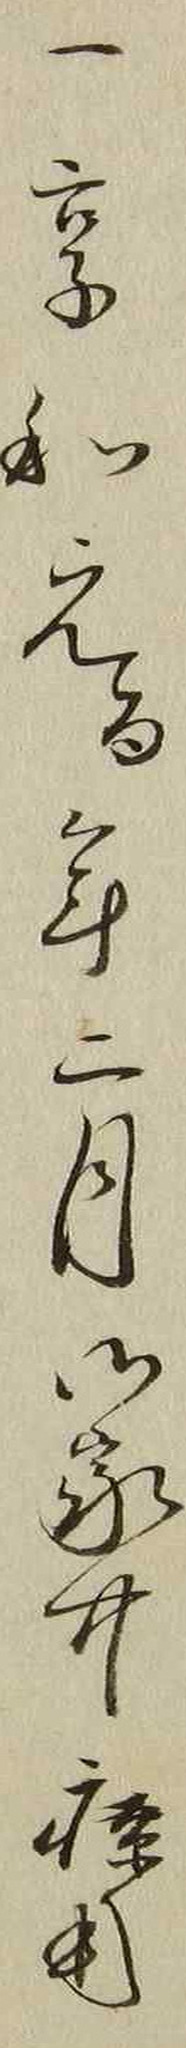一享和元酉年二月御家中療用
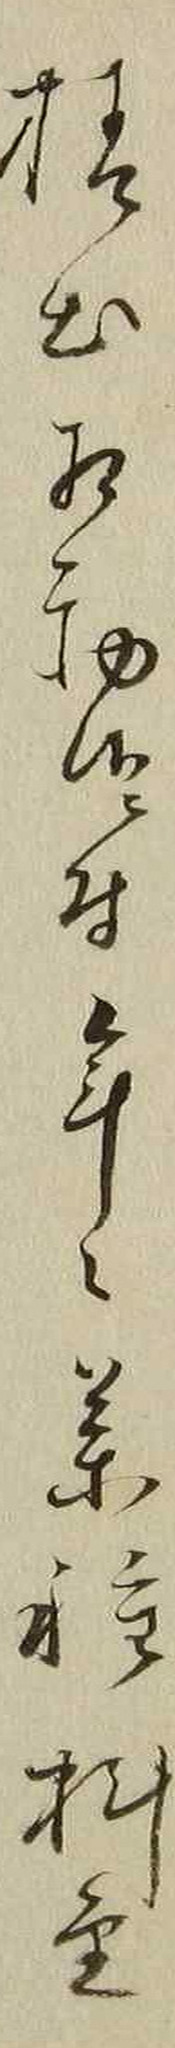精出相勤候ニ付年々薬種料金
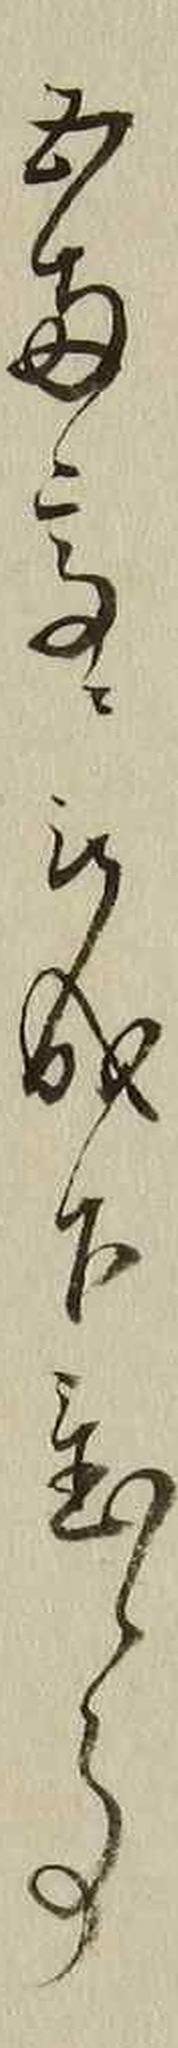五両高ニ被成下置候事
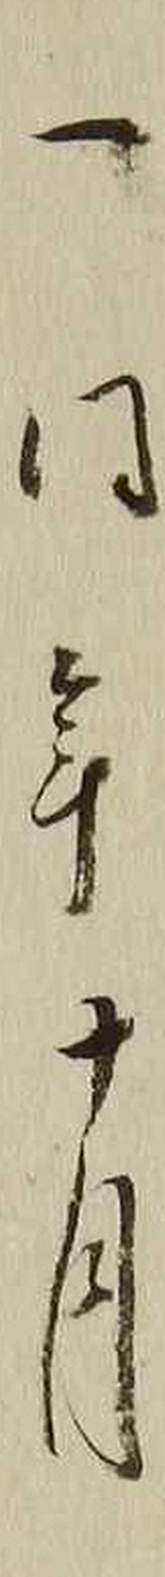一同年十月
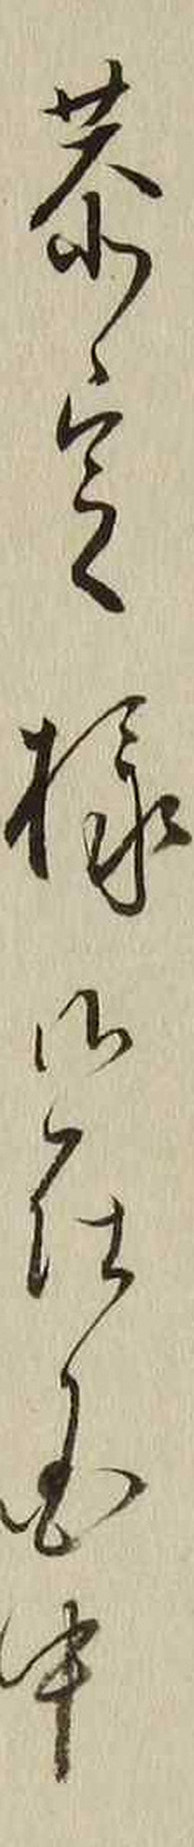恭定様御在国中
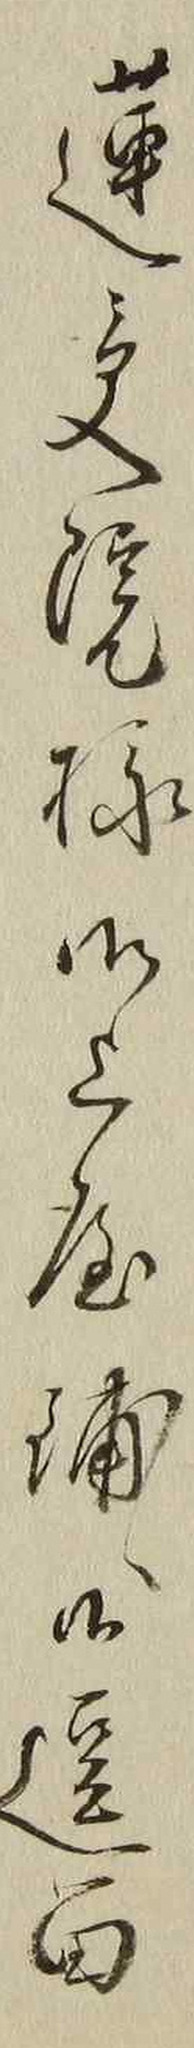蓮受院様御上屋鋪へ御逗留
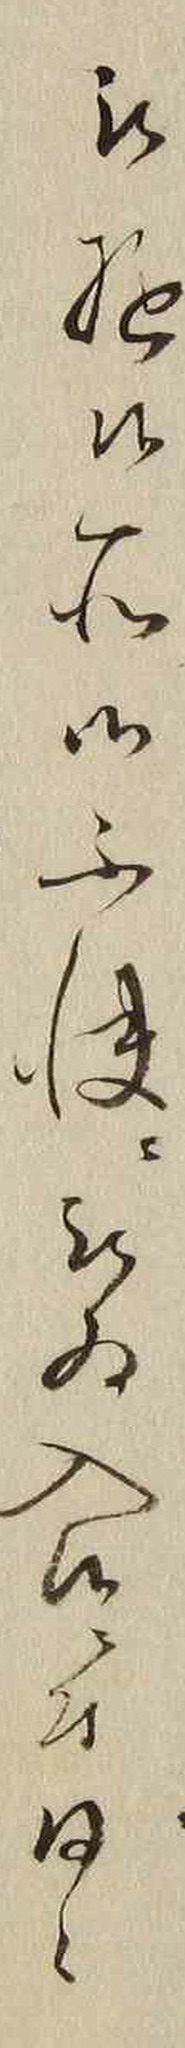被遊候所御不扶ニ被為入候ニ付日々
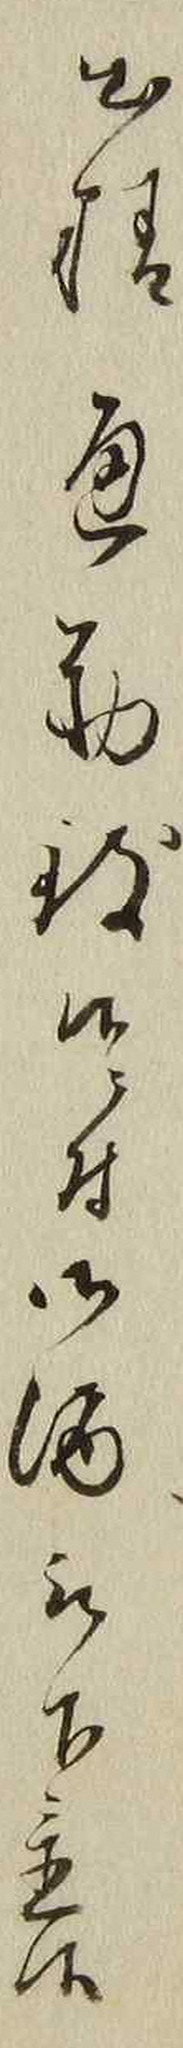出精通勤致候ニ付御酒被下置候
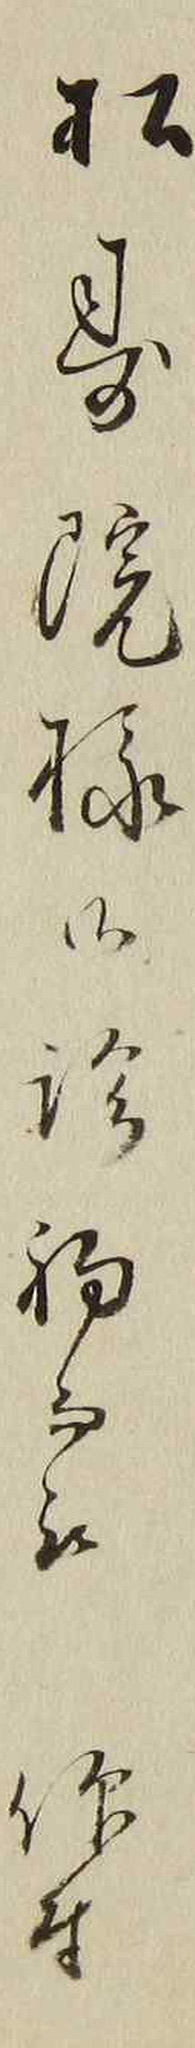松寿院様御診初而被仰付
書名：諸士系譜　巻之129　た之部5
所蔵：会津若松市立会津図書館
